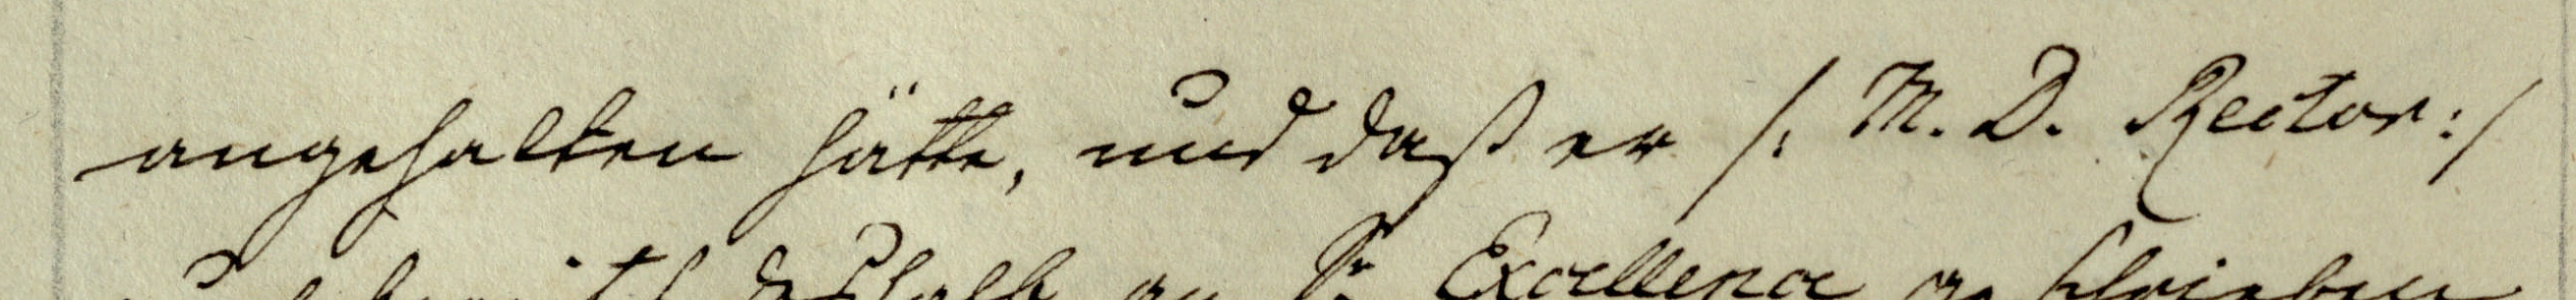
angehalten hätte, und daß er /: M. D. Rector :/
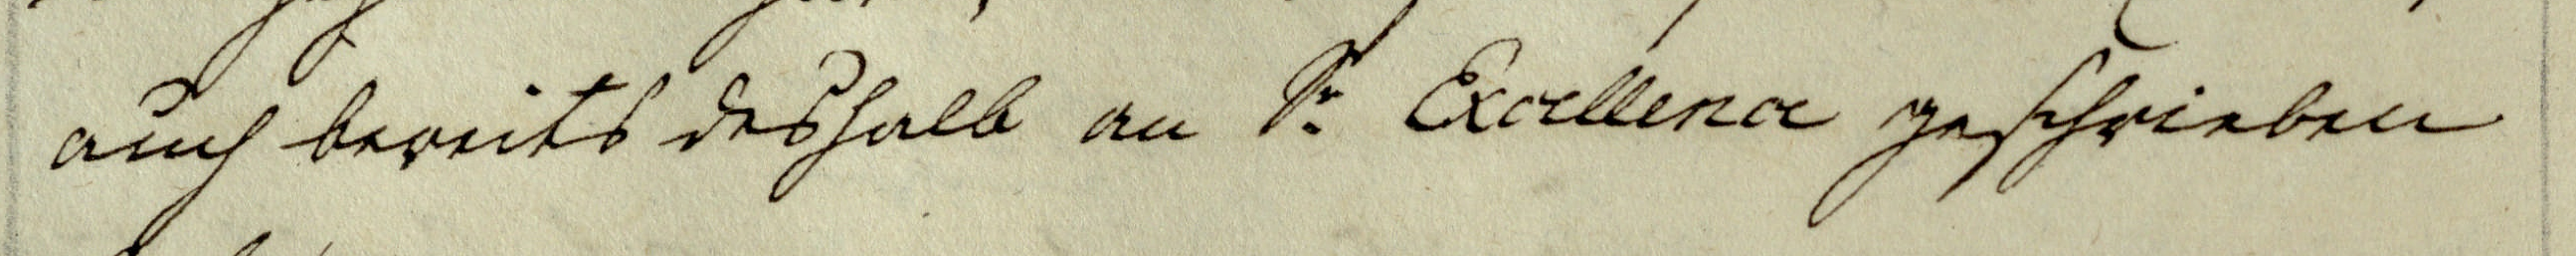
auch bereits deshalb an Sr Excellence geschrieben
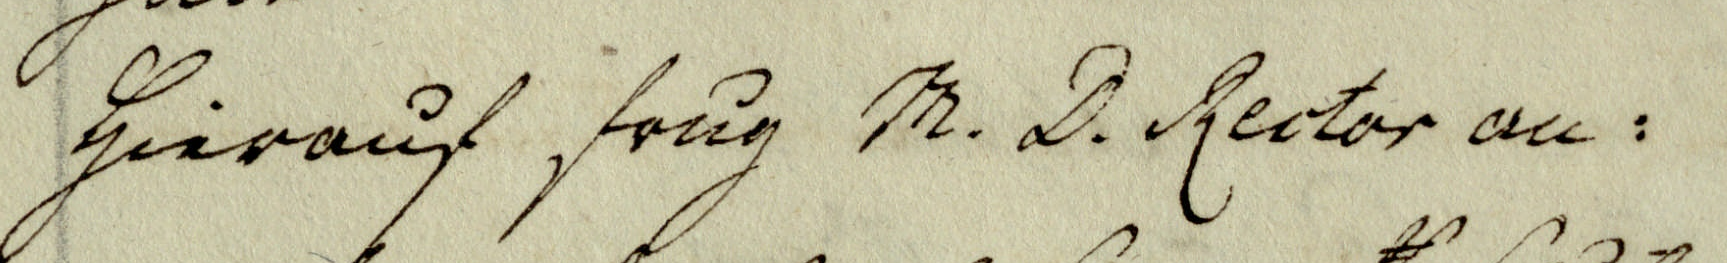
Hierauf frug M. D. Rector an:
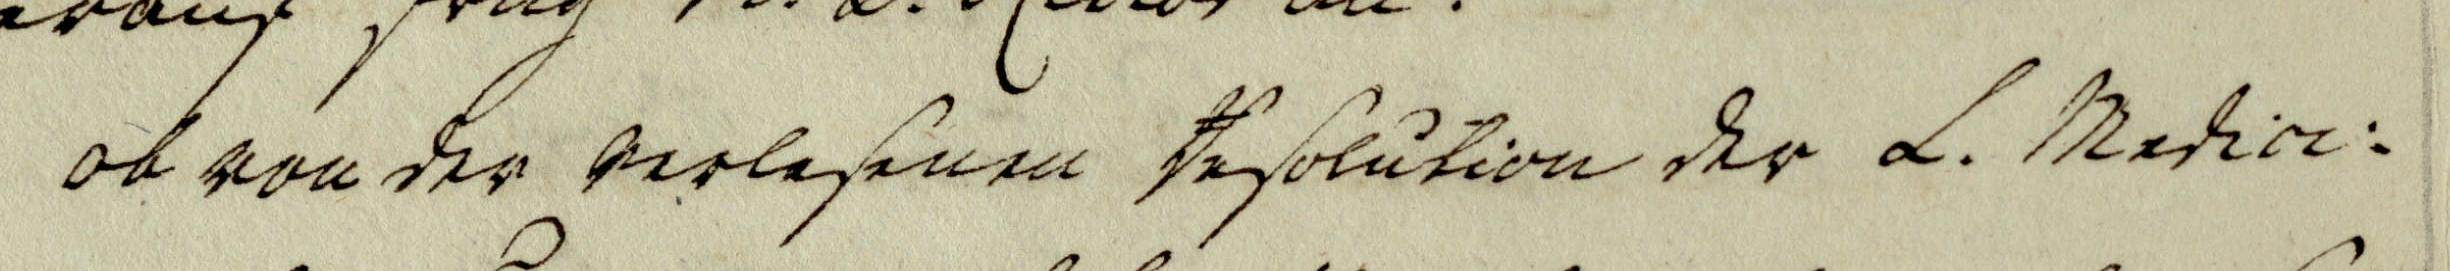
ob von der verlesenen Resolution der L. Medici¬
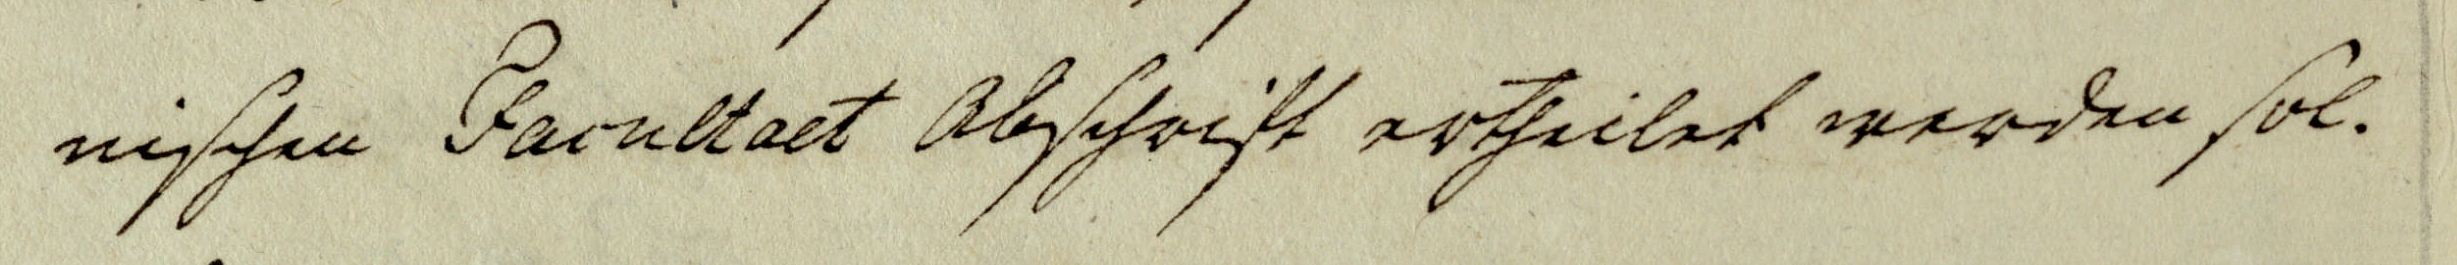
nischen Facultaet Abschrift ertheilet werden sol¬
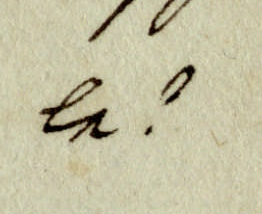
le?
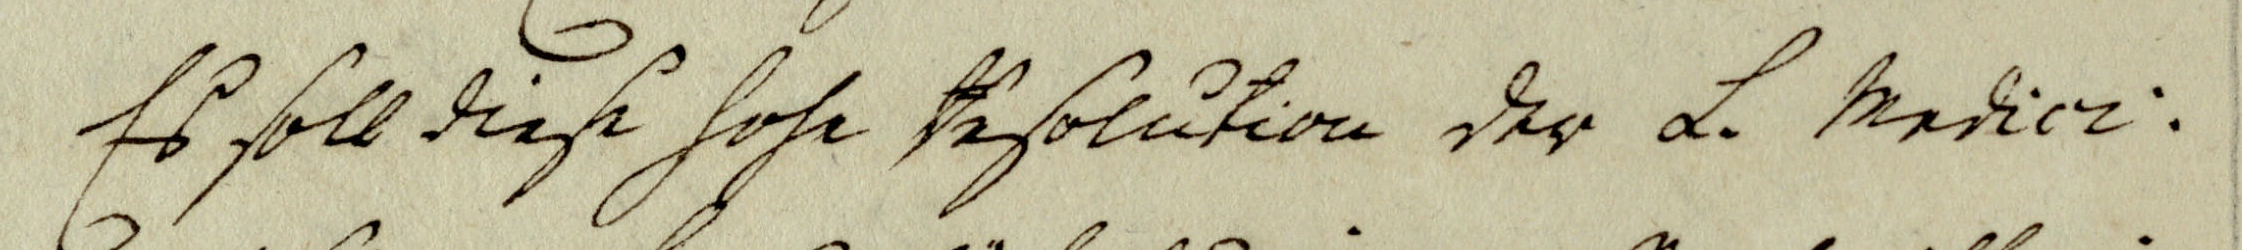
Es soll diese hohe Resolution der L. Medici¬
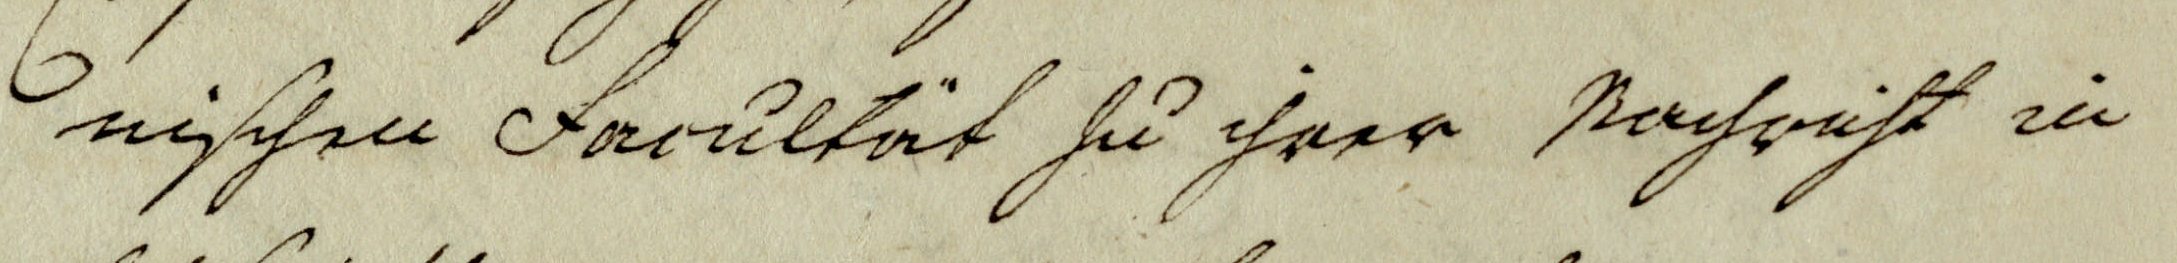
nischen Facultät zu ihrer Nachricht in
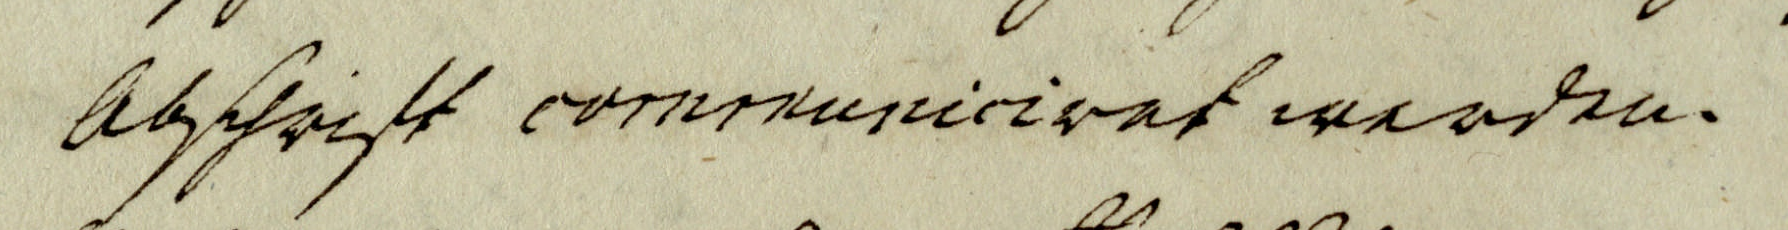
Abschrift communiciret werden.
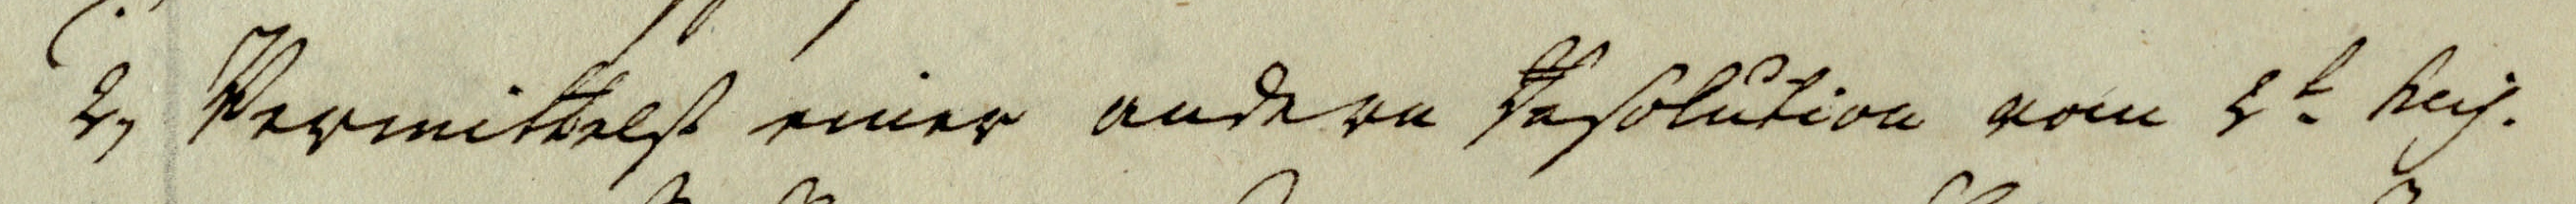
2., Vermittelst einer andern Resolution vom 2 t. huj.
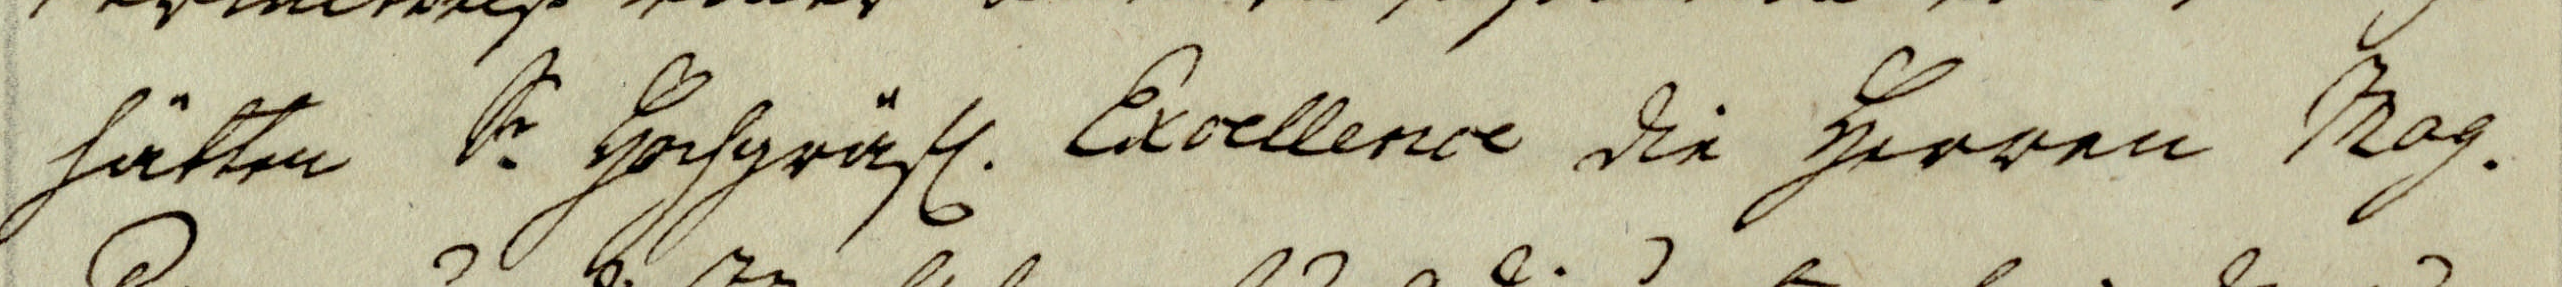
hätten Sr. Hochgräfl. Excellence die Herren Mag.
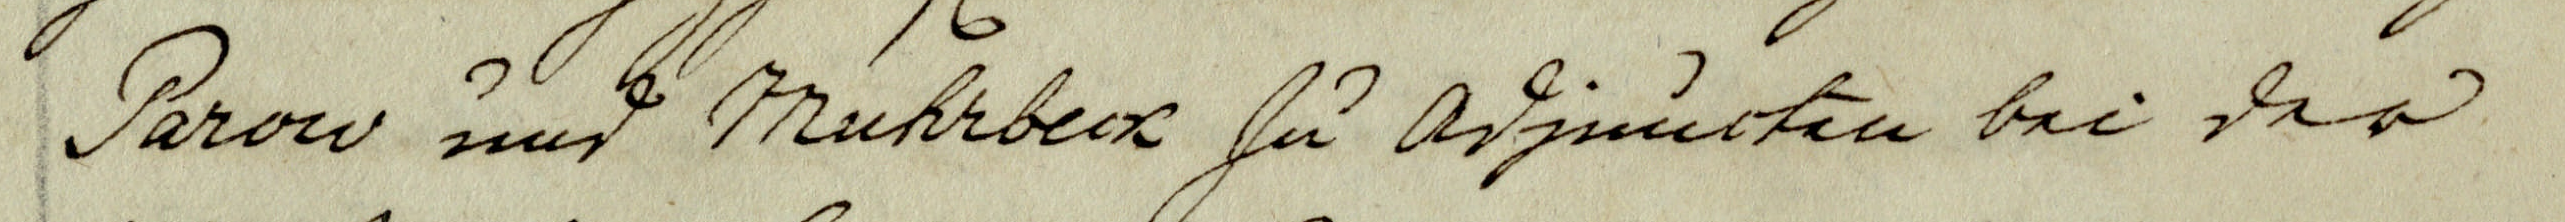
Parow und Muhrbeck zu Adjuncten bei der
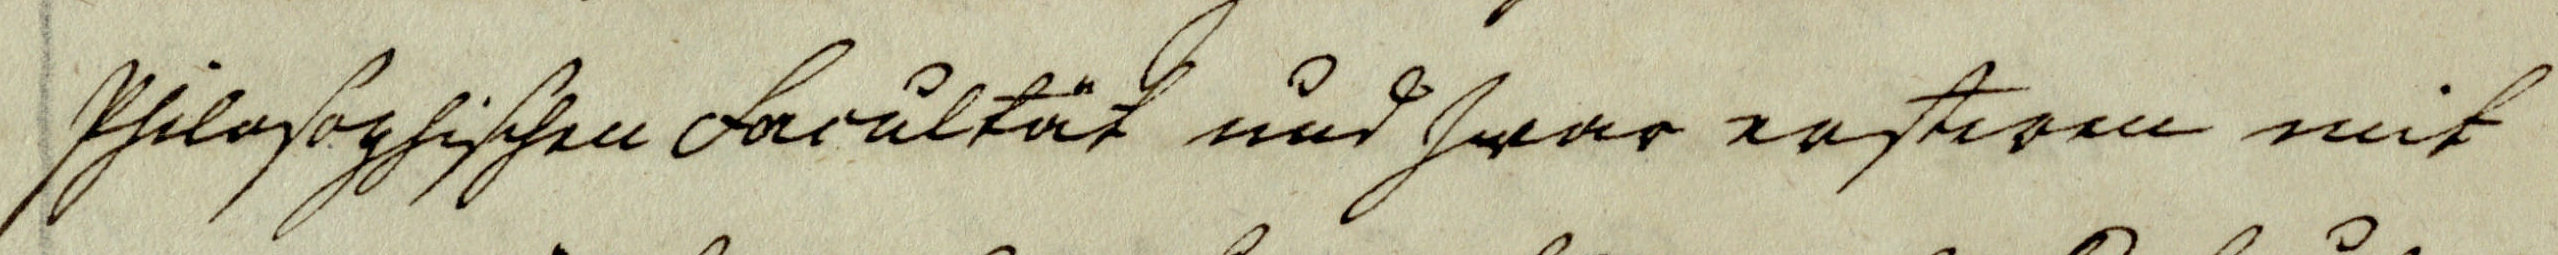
Philosophischen Facultät und zwar ersteren mit
